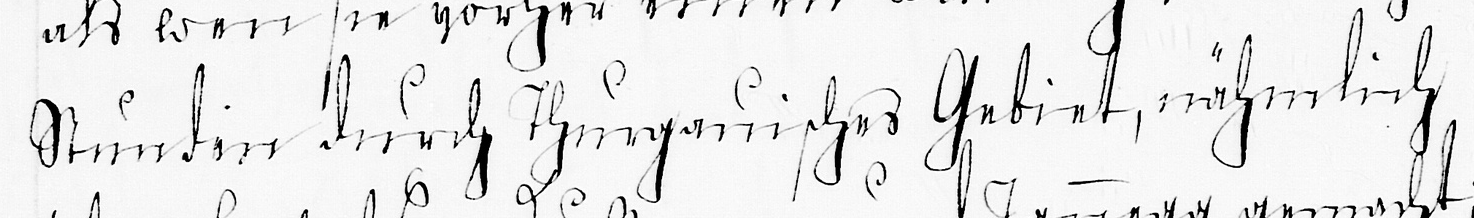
Stunden durch Thurgauisches Gebiet, nähmlich
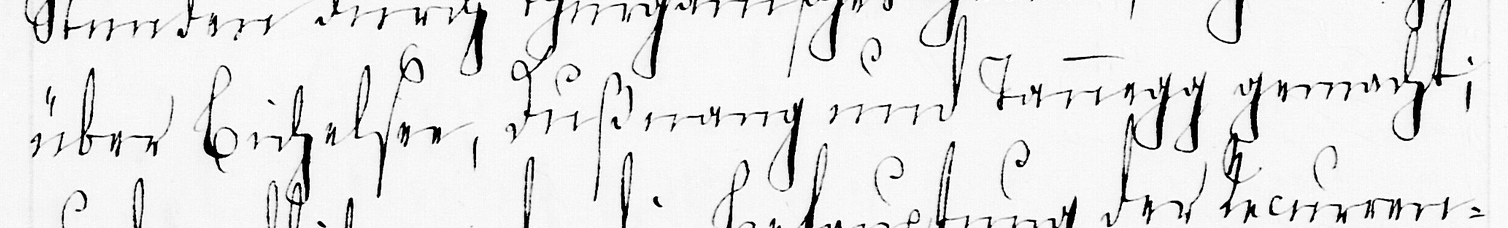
über Bichelsee, Dußnang und Tannegg gemacht;
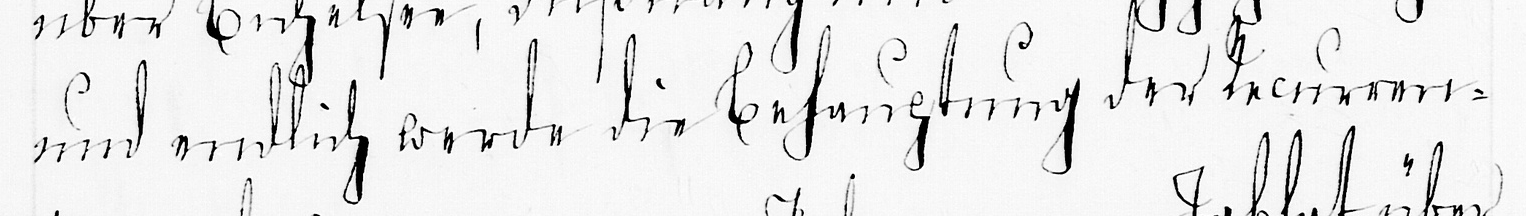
und endlich werde die Behauptung der Recurren¬
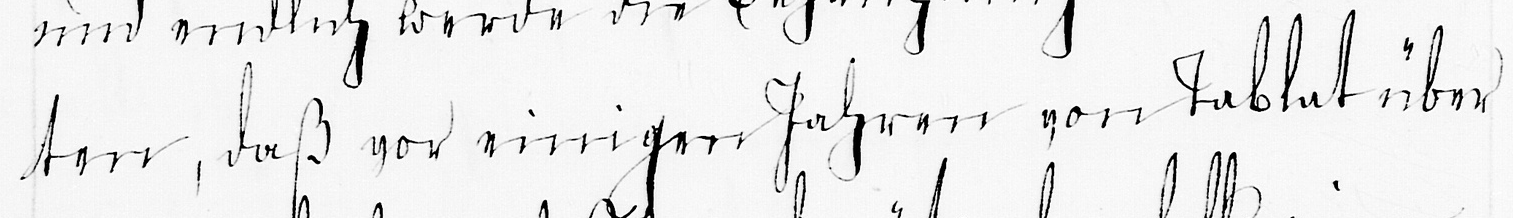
ten, daß vor einigen Jahren von Tablat über
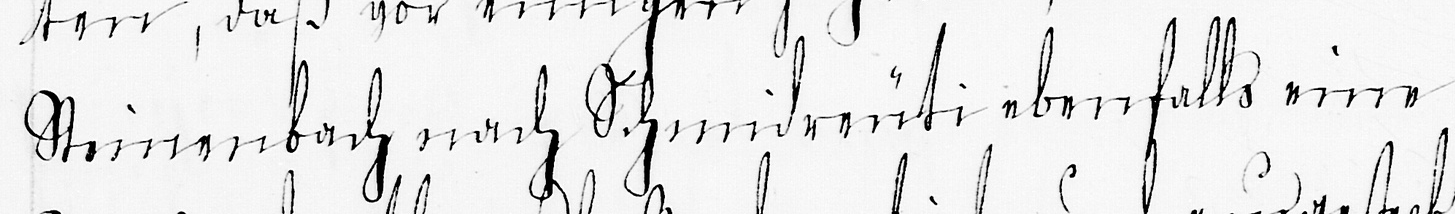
Steinenbach nach Schmidreuti ebenfalls eine
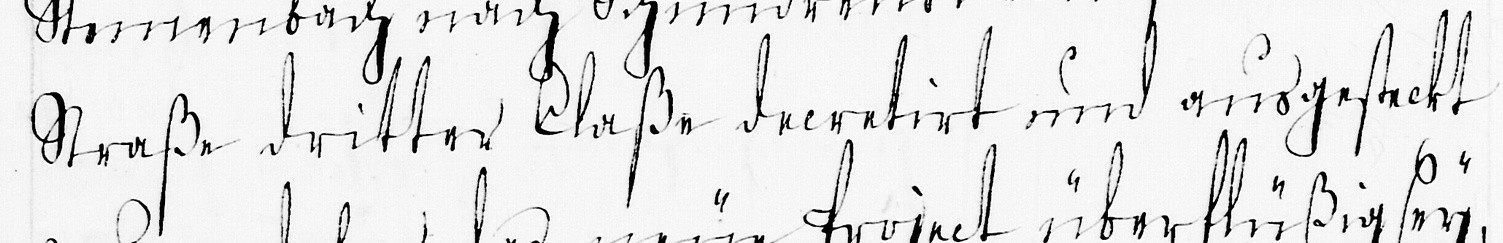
Straße dritter Claße decretirt und ausgesteckt
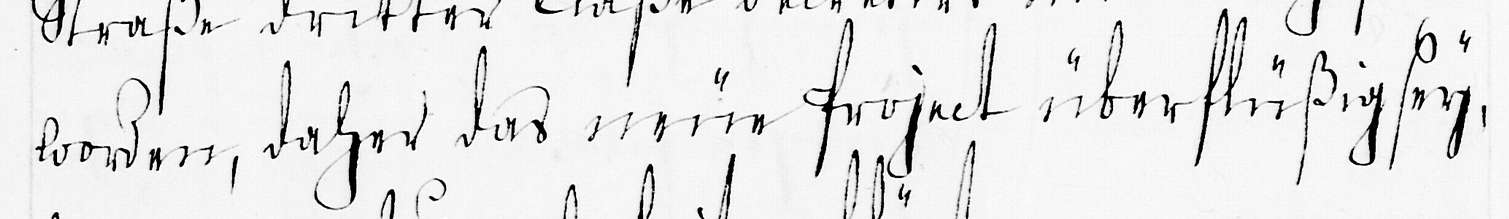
worden, daher das neue Project überflüßig sey,
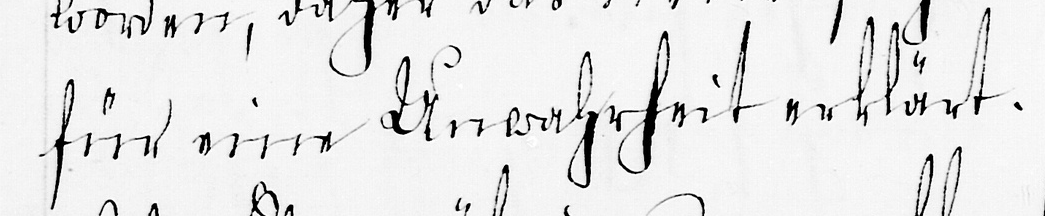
für eine Unwahrheit erklärt.
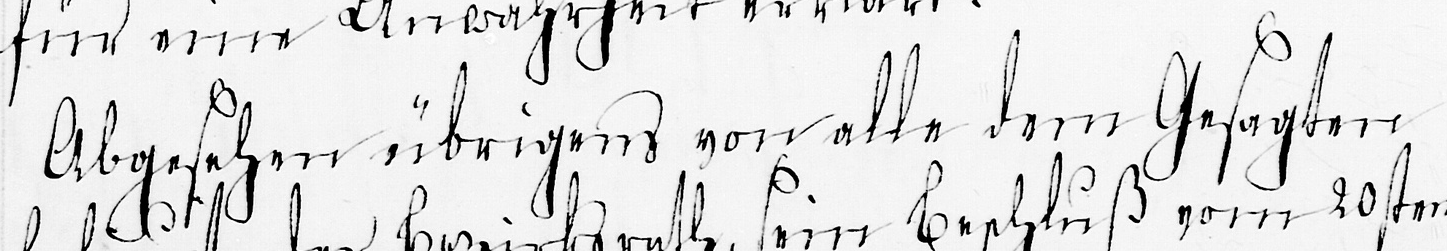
Abgesehen übrigens von alle dem Gesagten
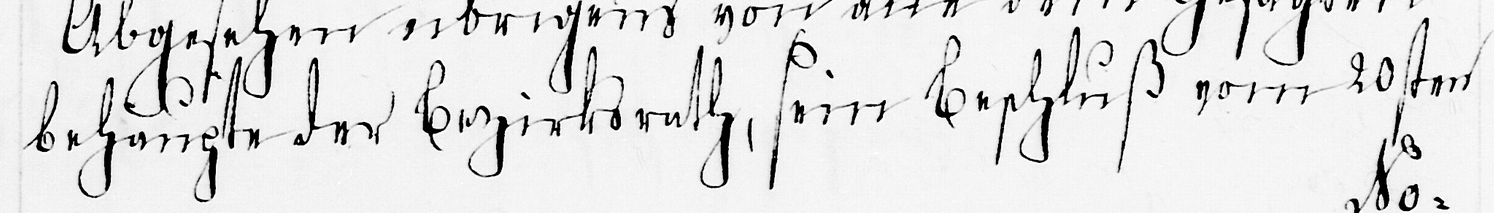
behaupte der Bezirksrath, sein Beschluß vom 20ten
